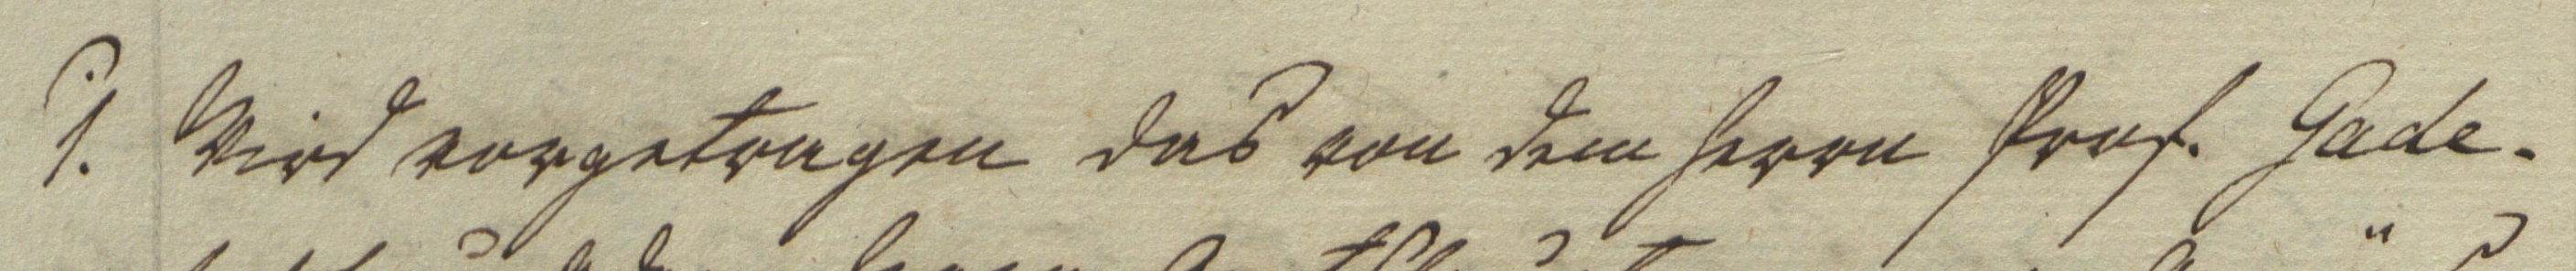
1. Wird vorgetragen das von dem Herrn Prof. Gade¬
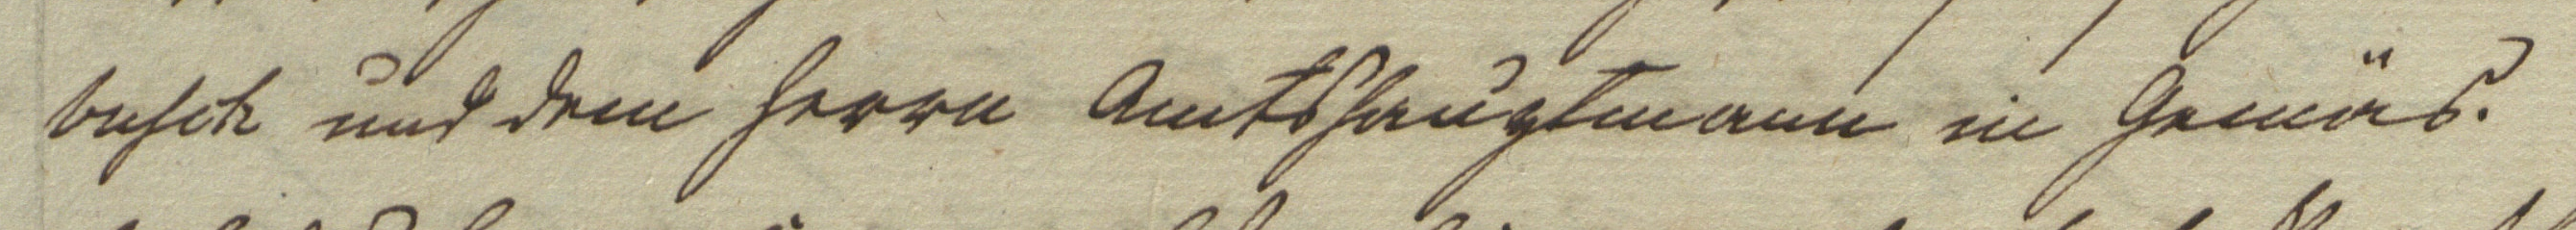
busch und dem Herrn Amtshauptmann in Gemäs¬
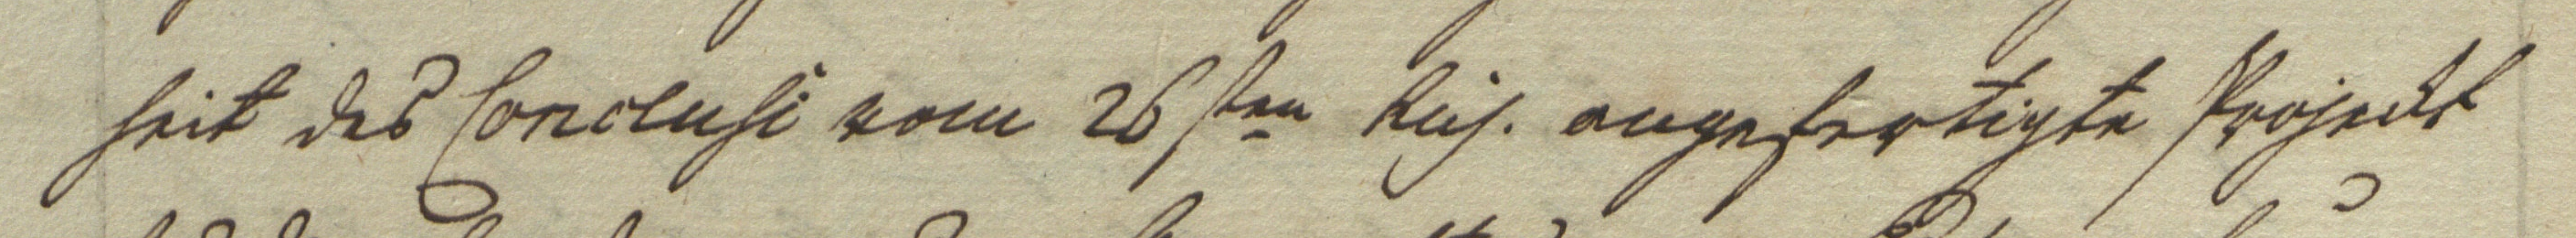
heit des Conclusi vom 26 sten huj. angefertigte Projeckt
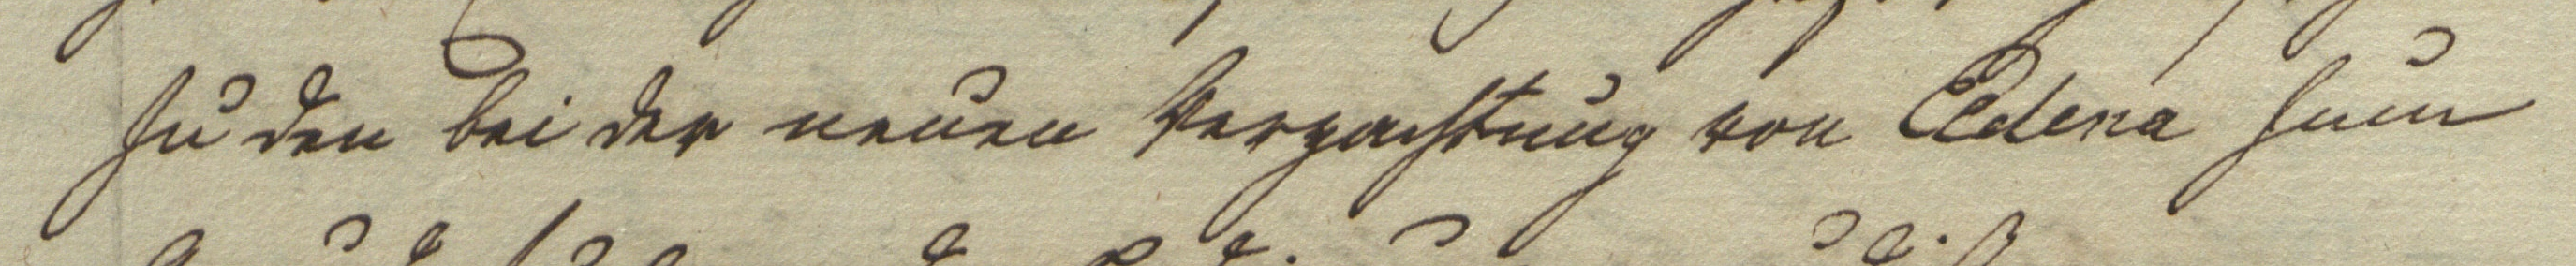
zu den bei der neuen Verpachtung von Eldena zum
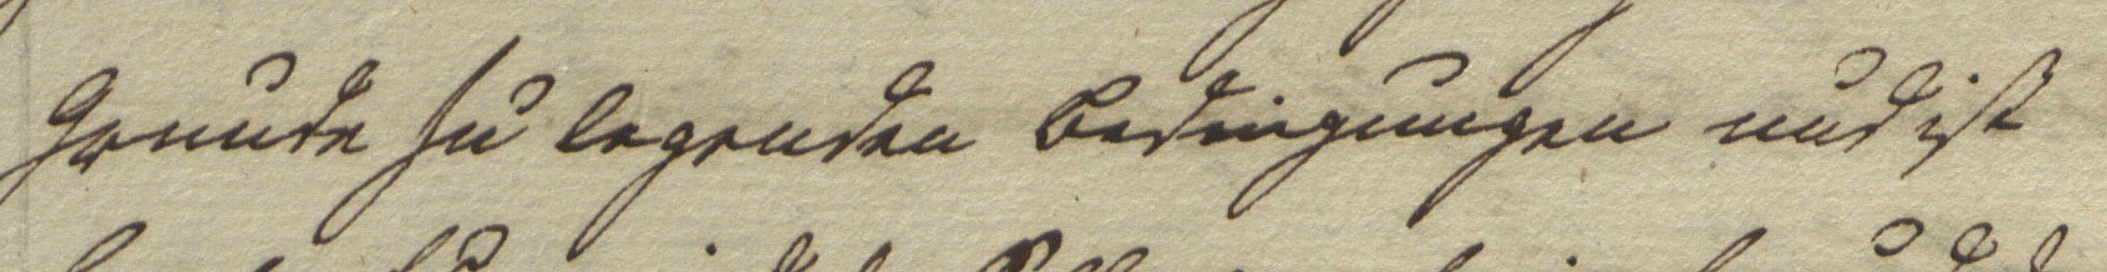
Grunde zu legenden Bedingungen und ist
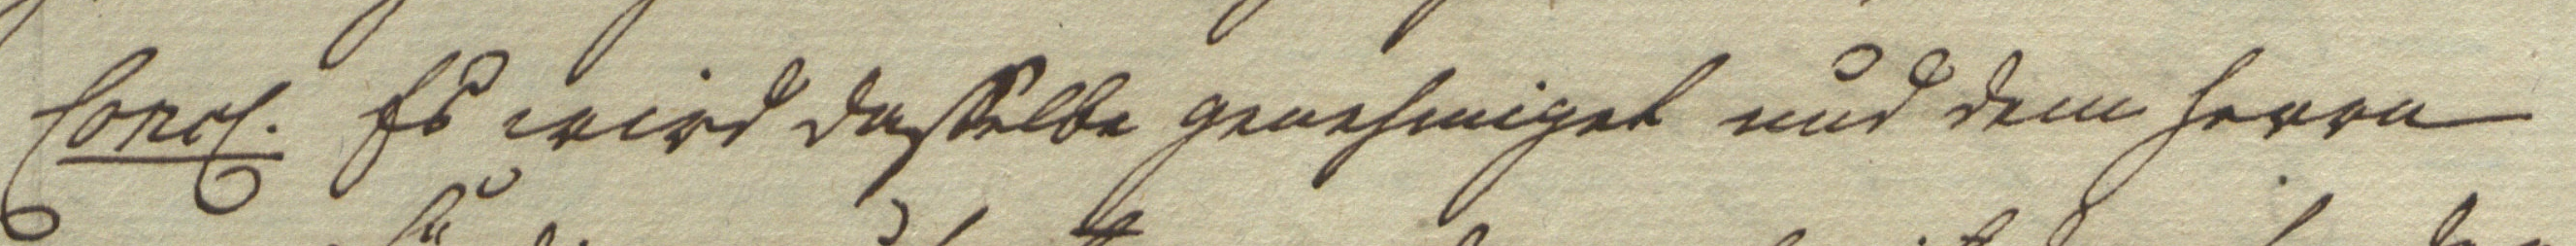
Concl. Es wird dasselbe genehmiget und dem Herrn
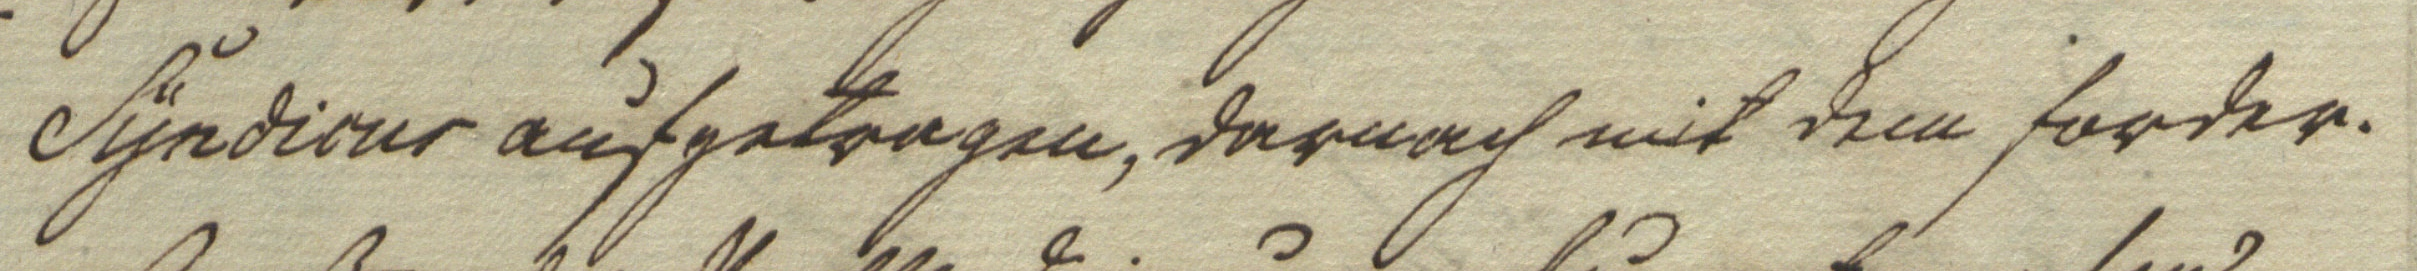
Sÿndicus aufgetragen, darnach mit dem forder¬
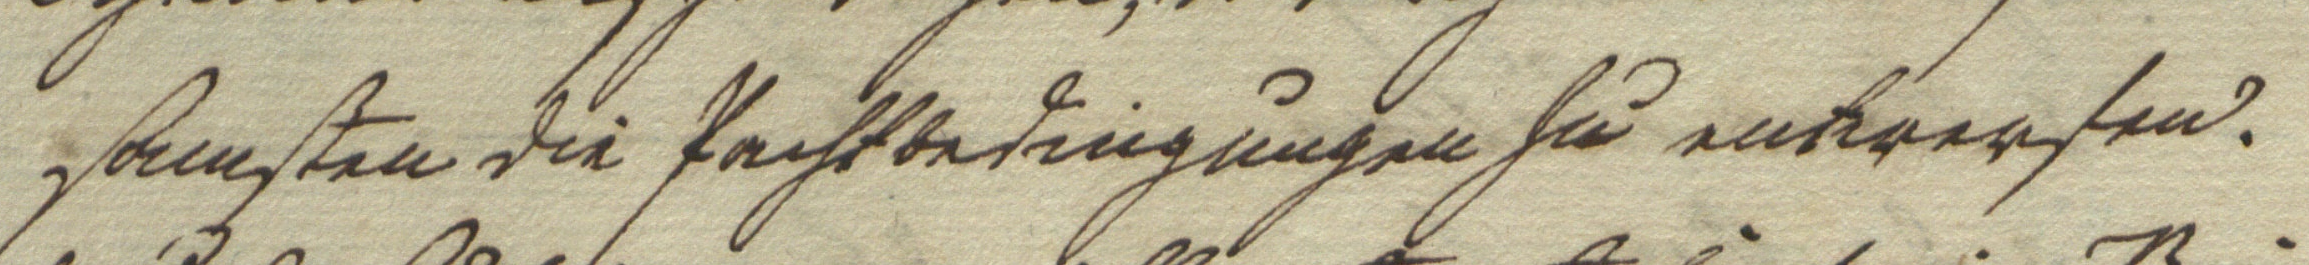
samsten die Pachtbedingungen zu entwerfen.
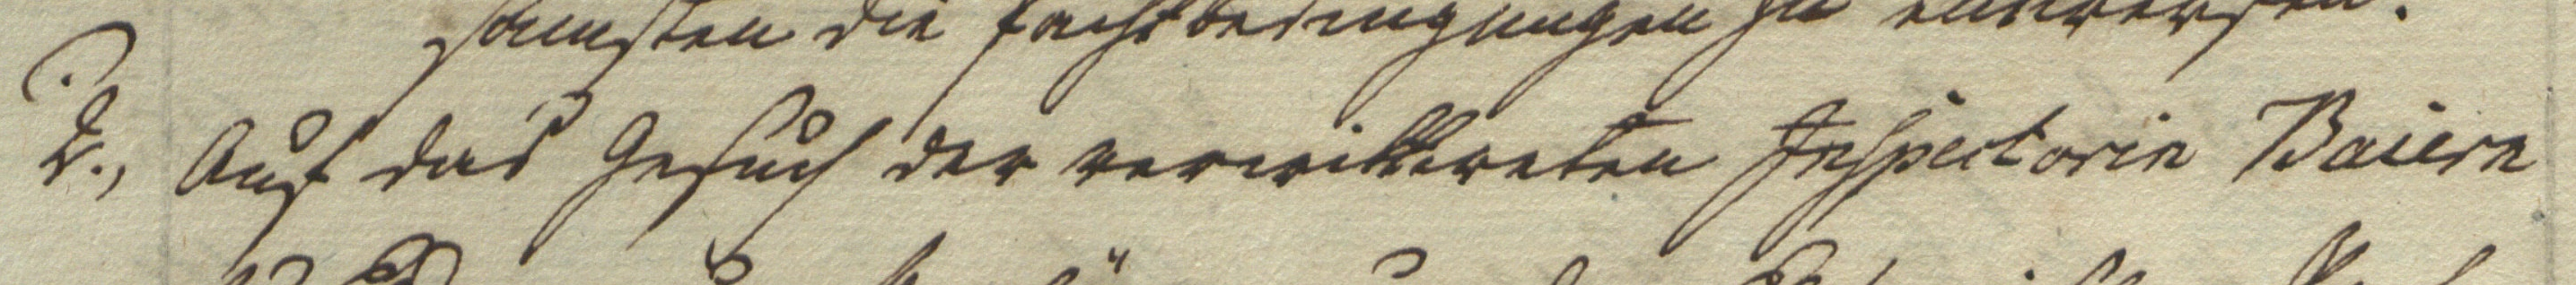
2., Auf das Gesuch der verwittweten Inspectorin Baiern
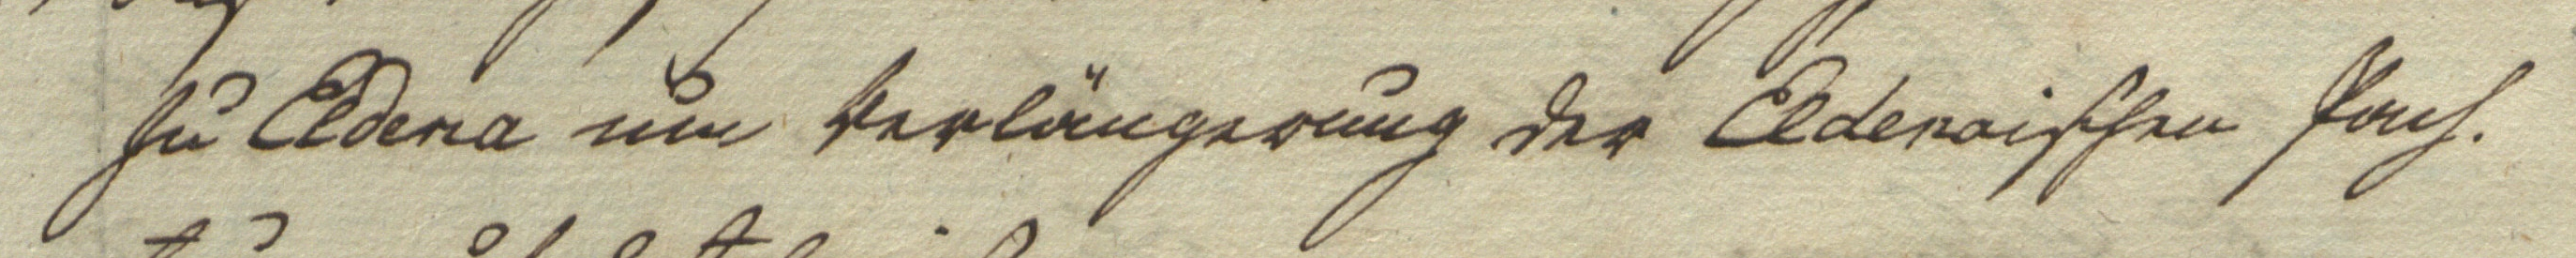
zu Eldena um Verlängerung der Eldenaischen Pach¬
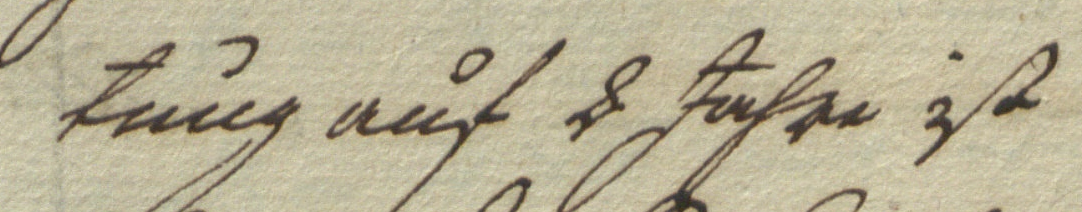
tung auf 2 Jahre ist
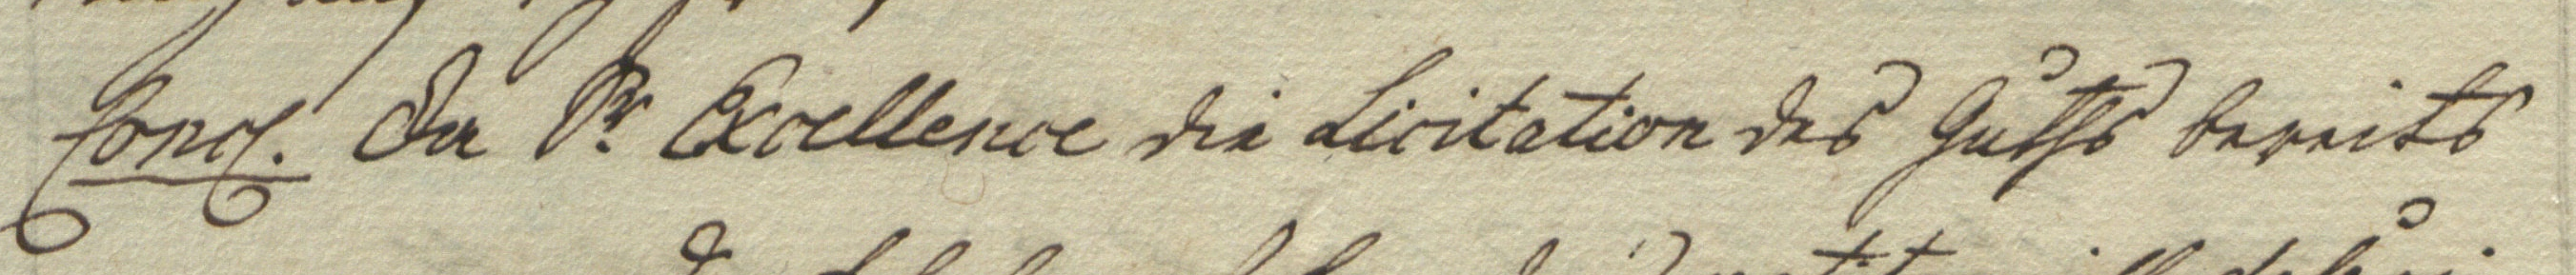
Concl. Da Sr Excellence die Licitation des Guths bereits
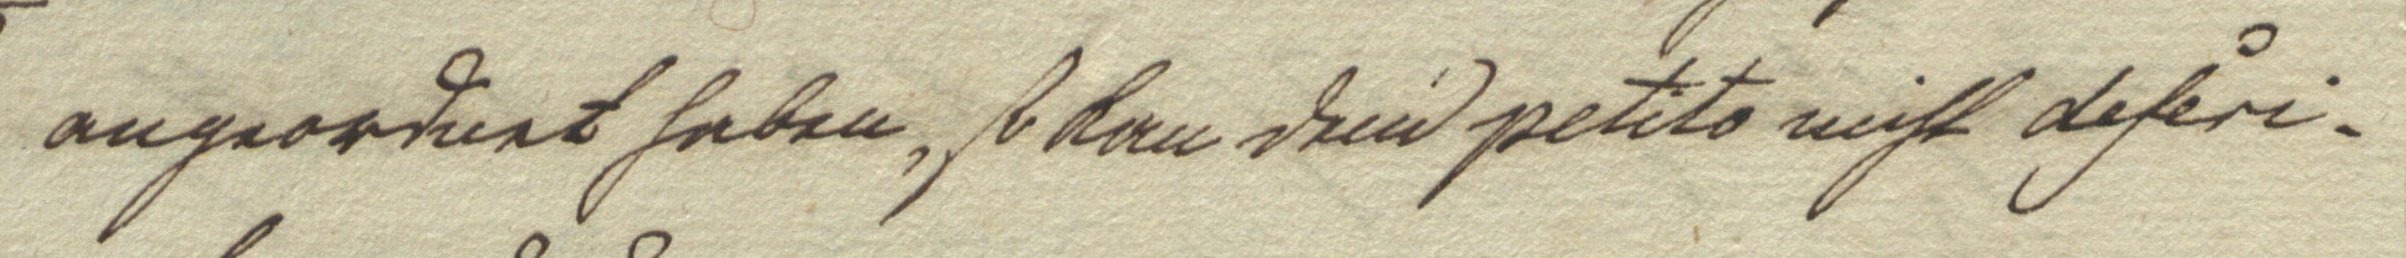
angeordnet haben, so kan den petito nicht deferi¬
